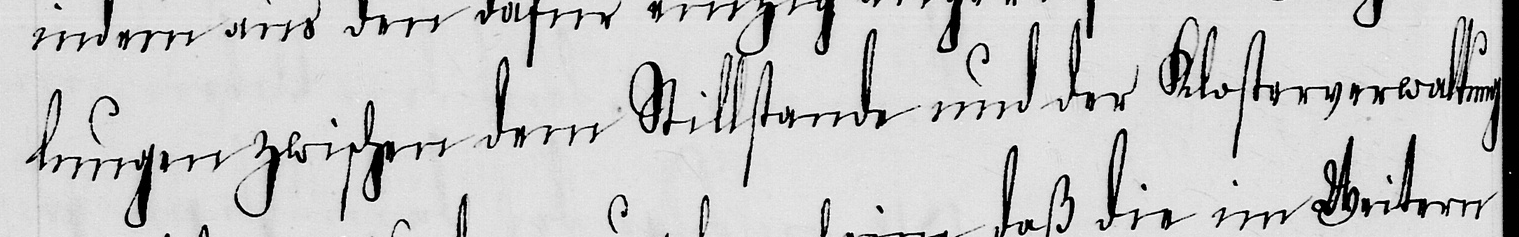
lungen zwischen dem Stillstande und der Klosterverwaltung
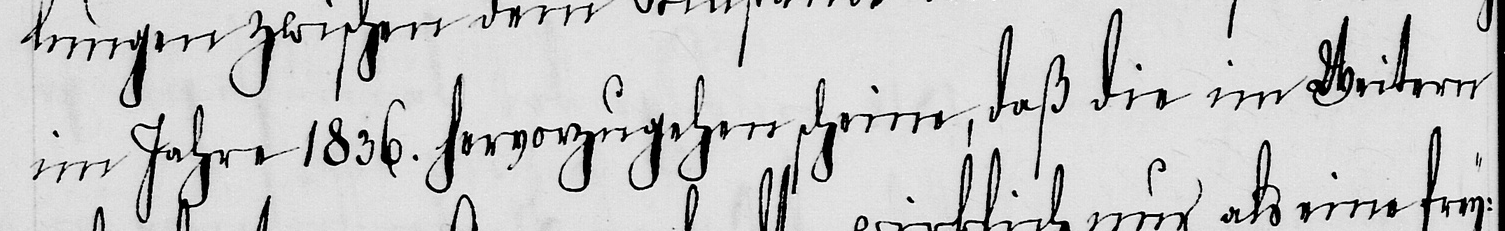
im Jahre 1836. hervorzugehen scheine, daß die im Weitern
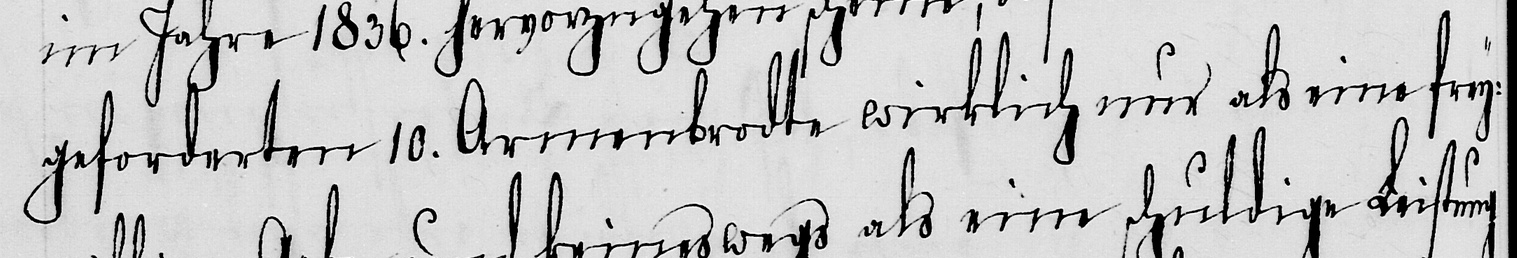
geforderten 10. Armenbrodte wirklich nur als eine fre¬
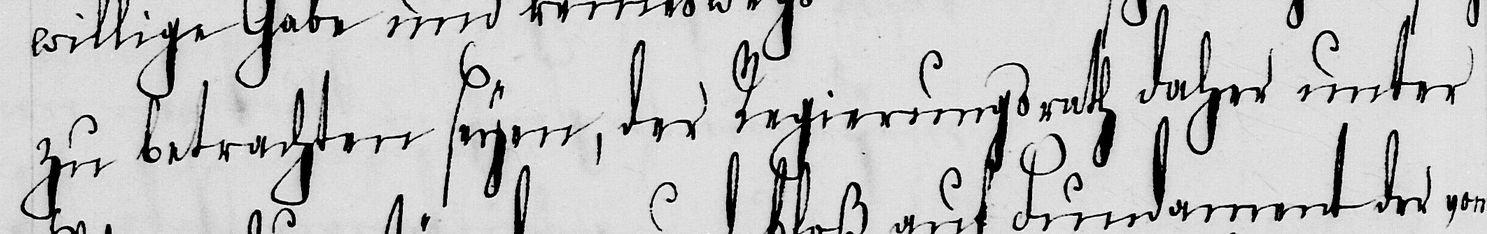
zu betrachten seyen, der Regierungsrath daher unter
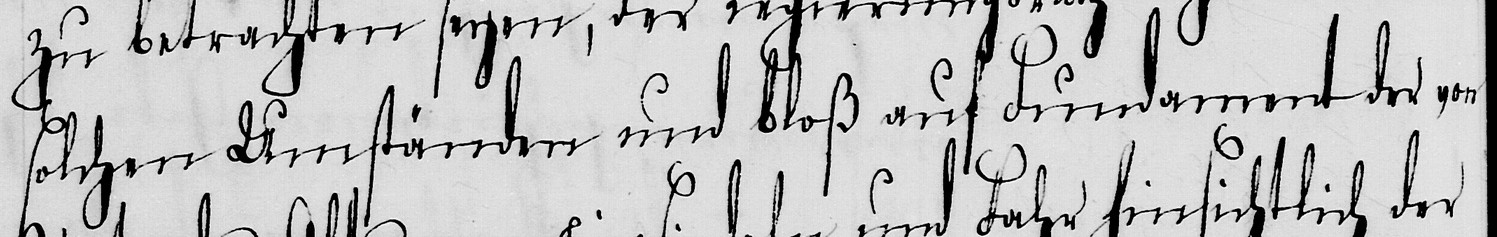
solchen Umständen und bloß auf Fundament der von
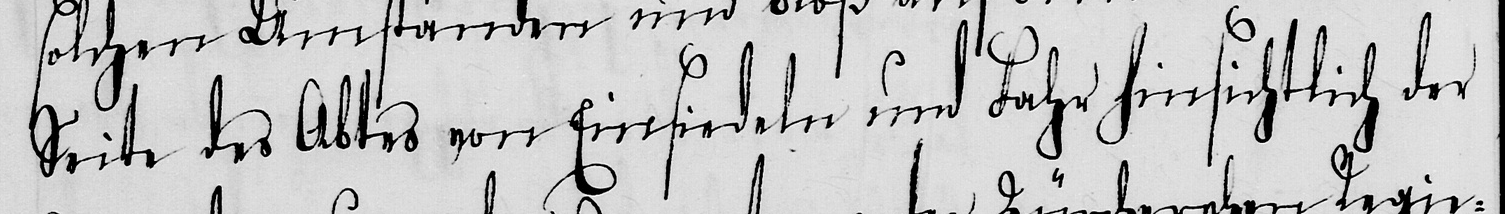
Seite des Abtes von Einsiedeln und Fahr hinsichtlich der
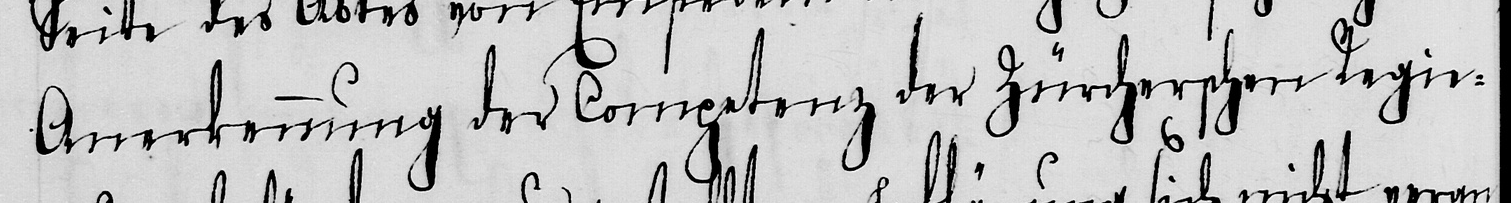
Anerkennung der Competenz der Zürcherschen Regie¬
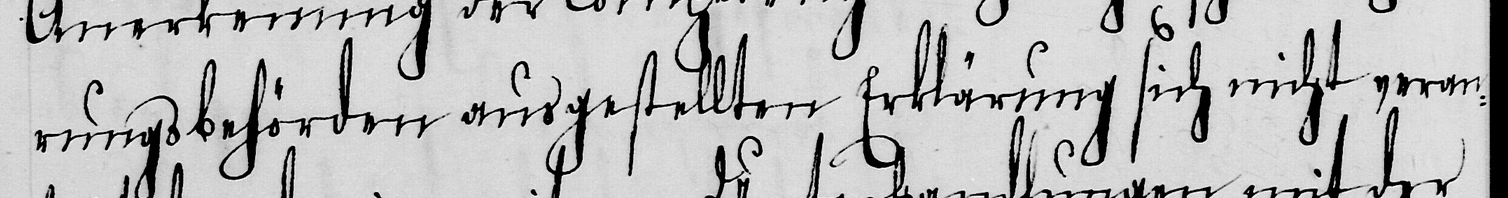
rungsbehörden ausgestellten Erklärung sich nicht veran¬
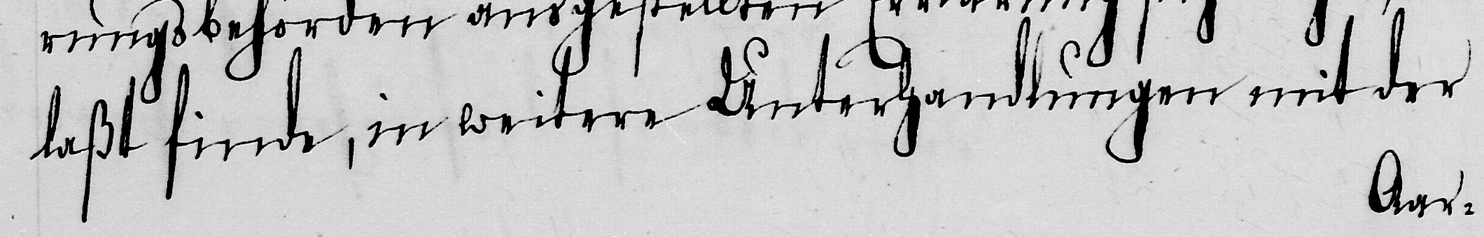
laßt finde, in weitere Unterhandlungen mit der
